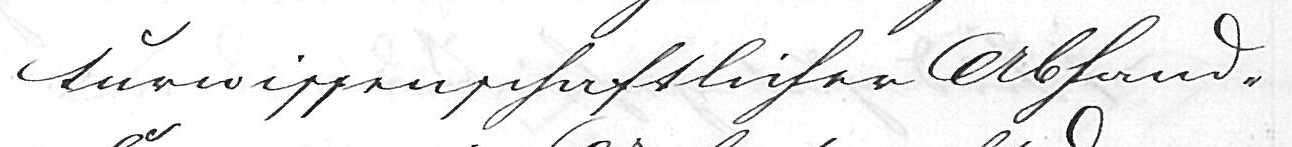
turwissenschaftlicher Abhand-
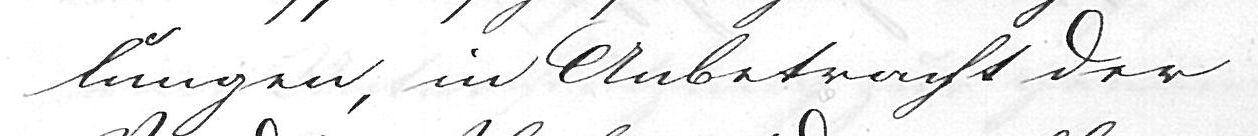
lungen, in Anbetracht der
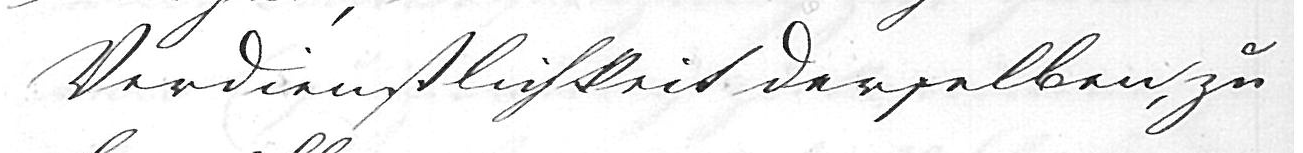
Verdienstlichkeit derselben, zu
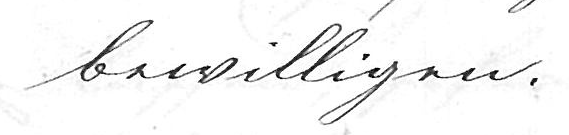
bewilligen.
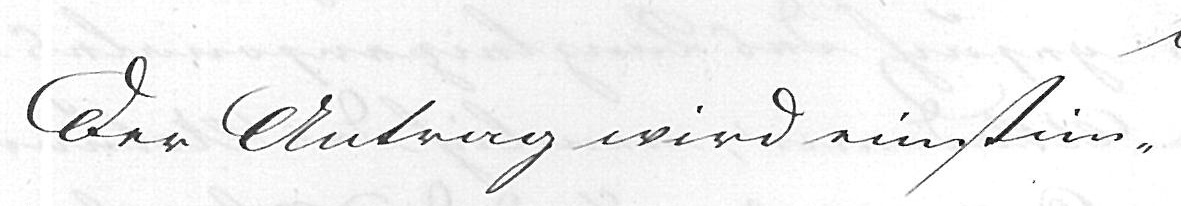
Der Antrag wird einstim-
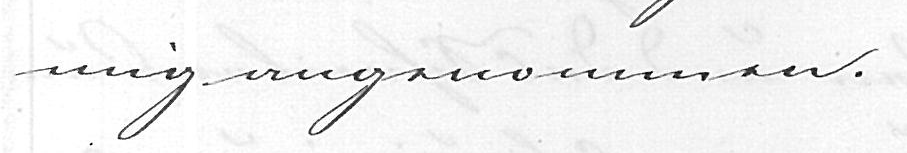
mig angenommen.
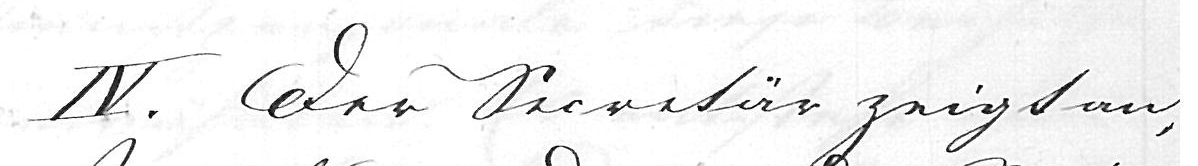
IV. Der Secretär zeigt an,
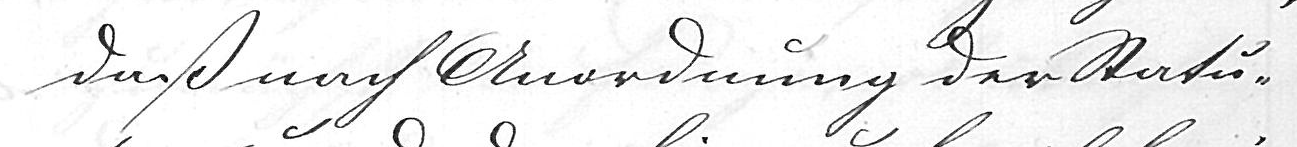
daß nach Anordnung der Statu-
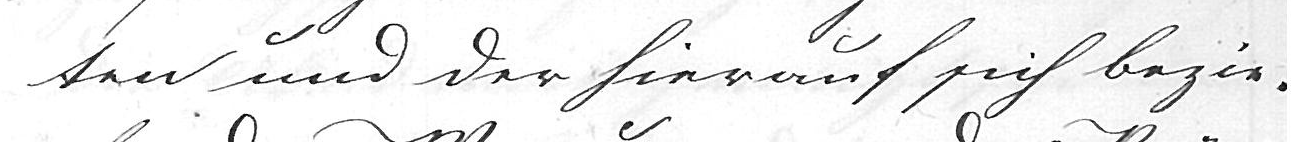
ten und der hierauf sich bezie-
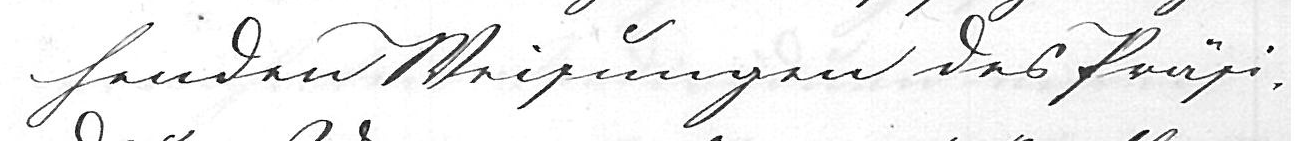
henden Weisungen des Präsi-
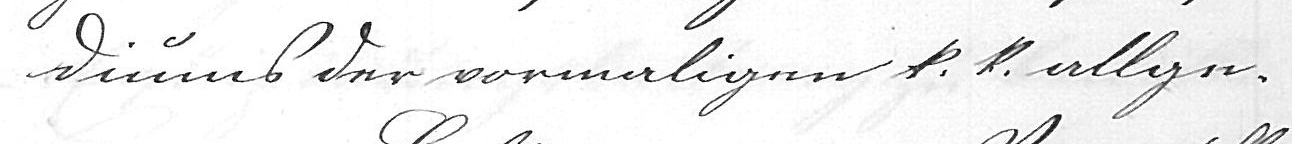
diums der vormaligen k. k. allge-
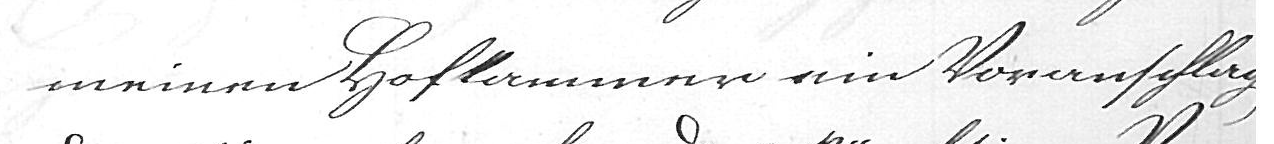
meinen Hofkammer ein Voranschlag
